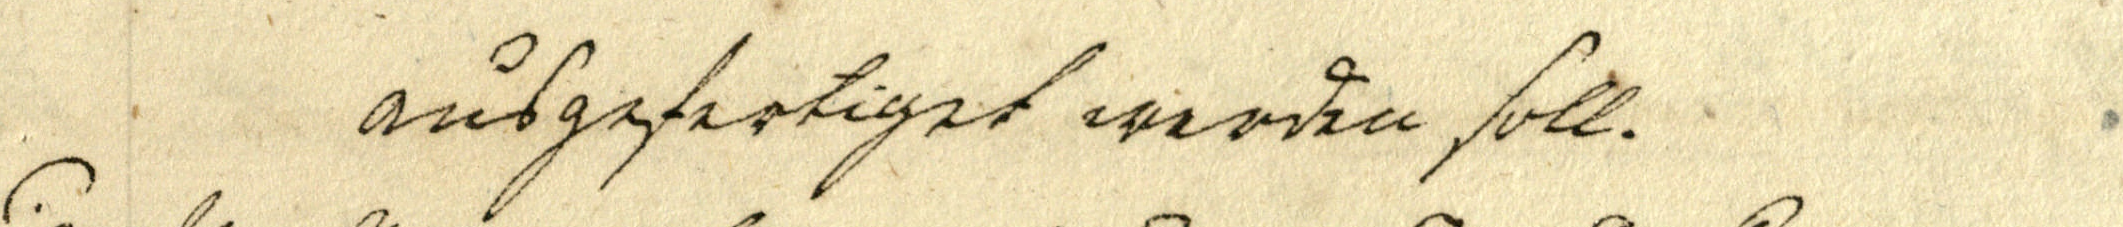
ausgefertiget werden soll.
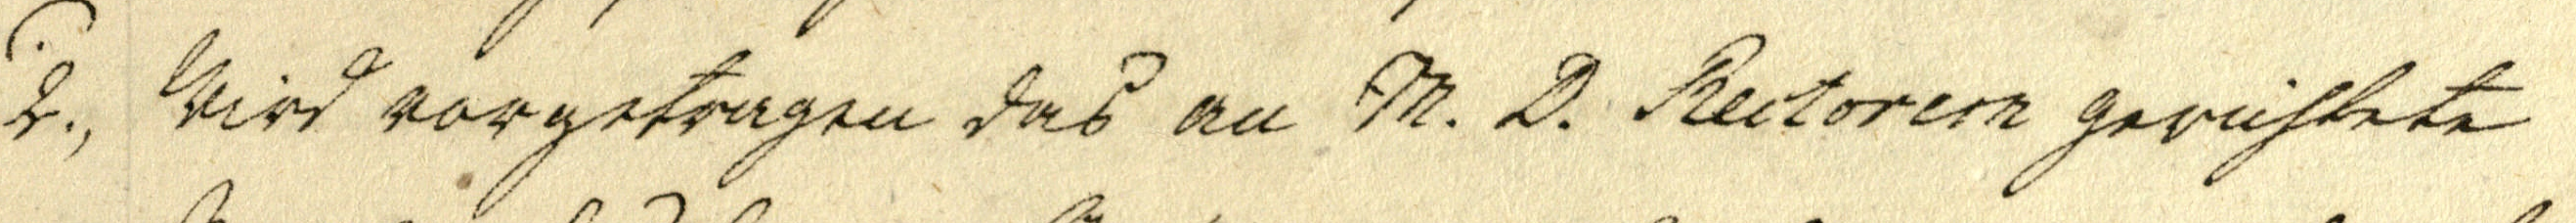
2. Wird vorgetragen das an M. D. Rectorem gerichtete
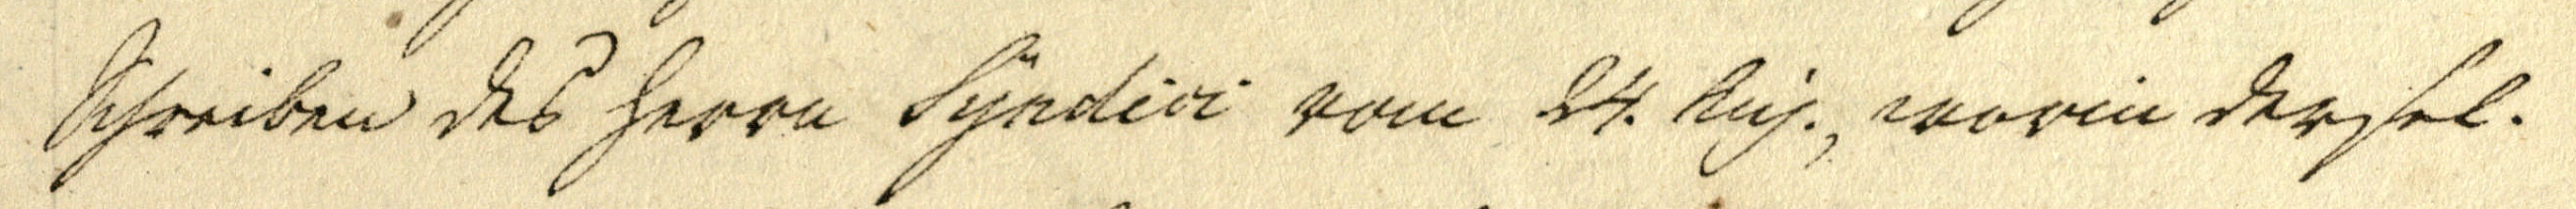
Schreiben des herrn Sÿndici vom 24. huj., worin dersel¬
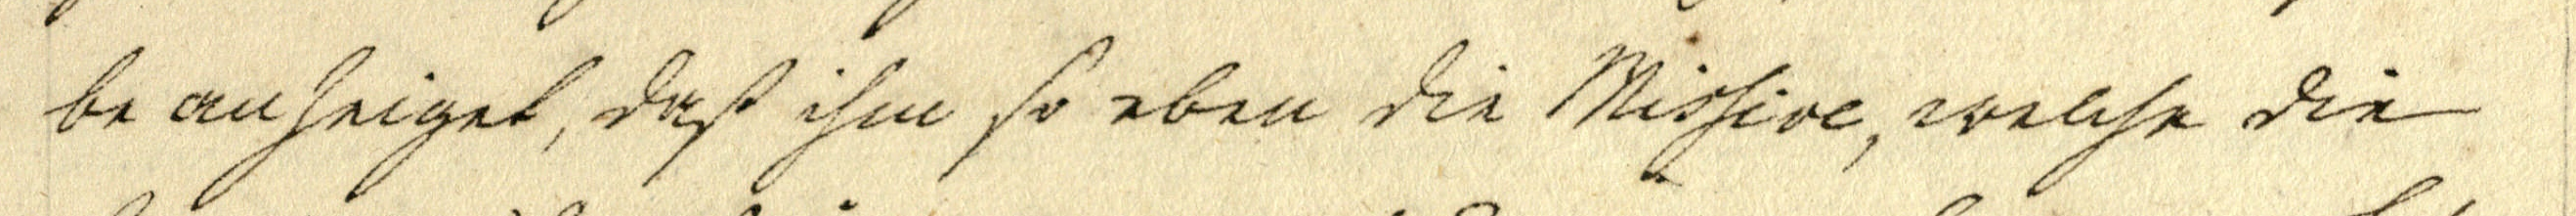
be anzeiget, daß ihm so eben die Missive, welche die
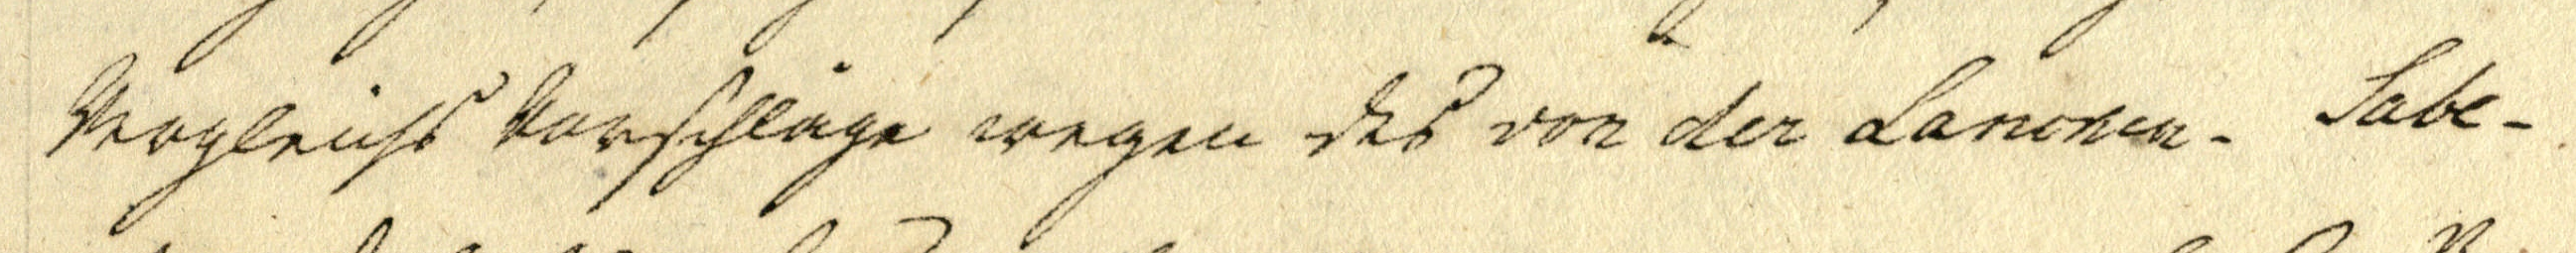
Vergleichs Vorschläge wegen des von der Lancken Sabe¬
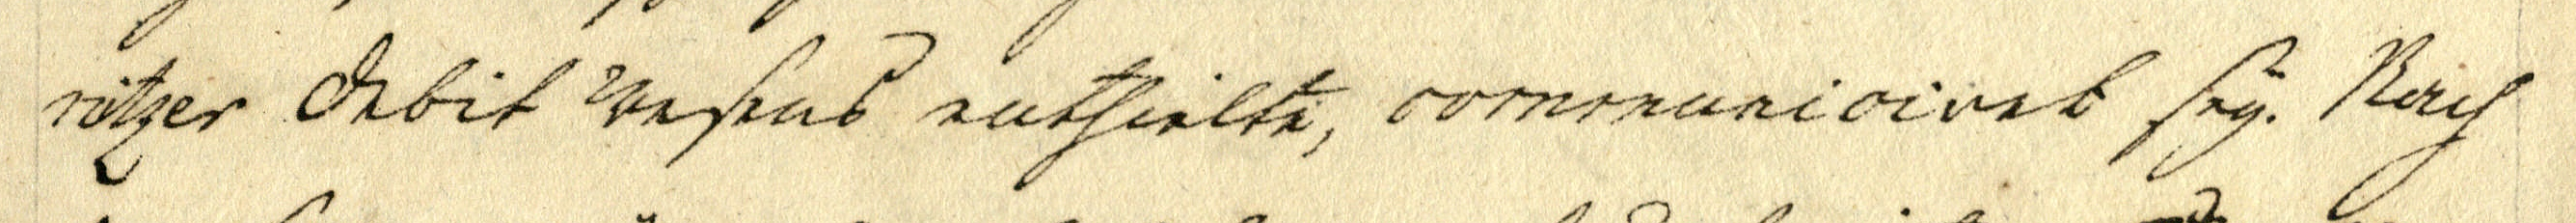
nitzer Debit Wesens enthielte, communiciret seÿ. Nach
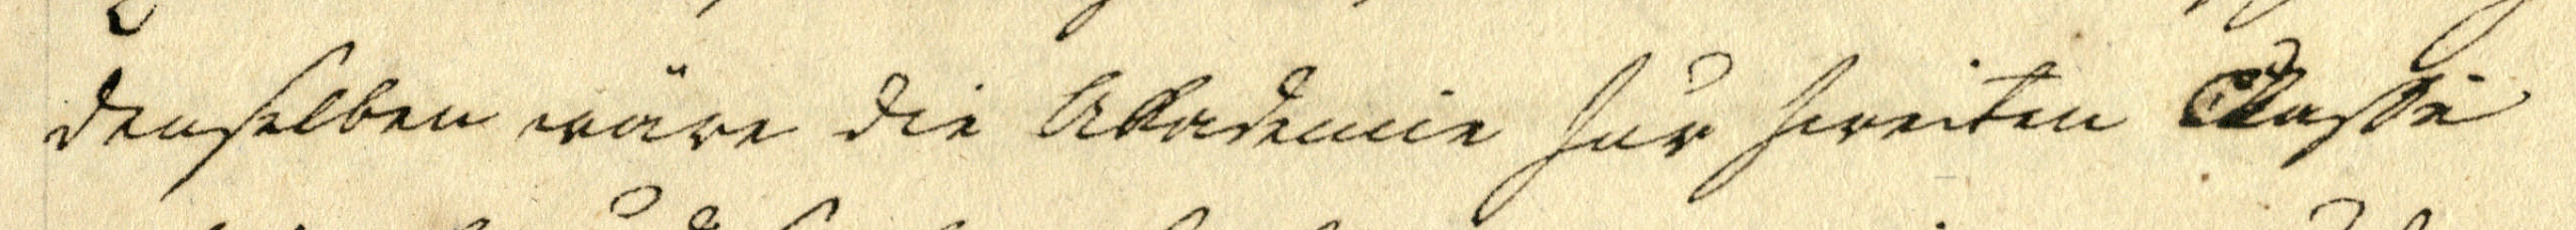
denselben wäre die Akademie zur zweiten Classe
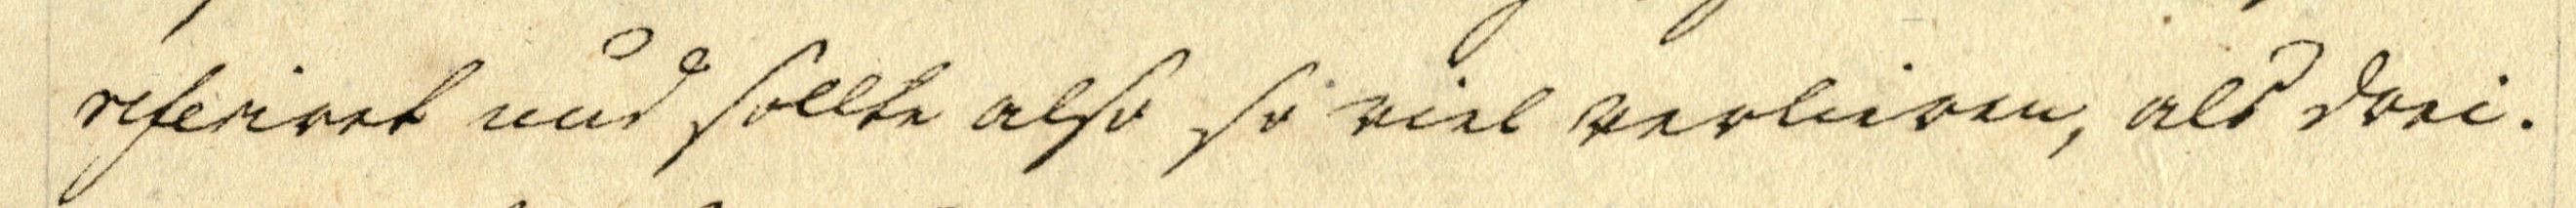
referiret und sollte also so viel verlieren, als drei¬
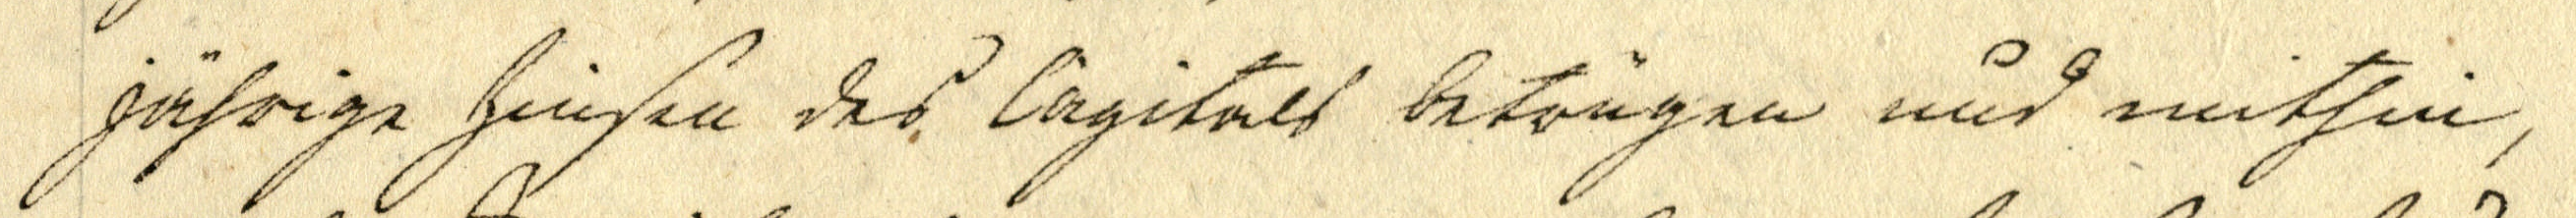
jährige Zinsen des Capitals betrügen und mithin
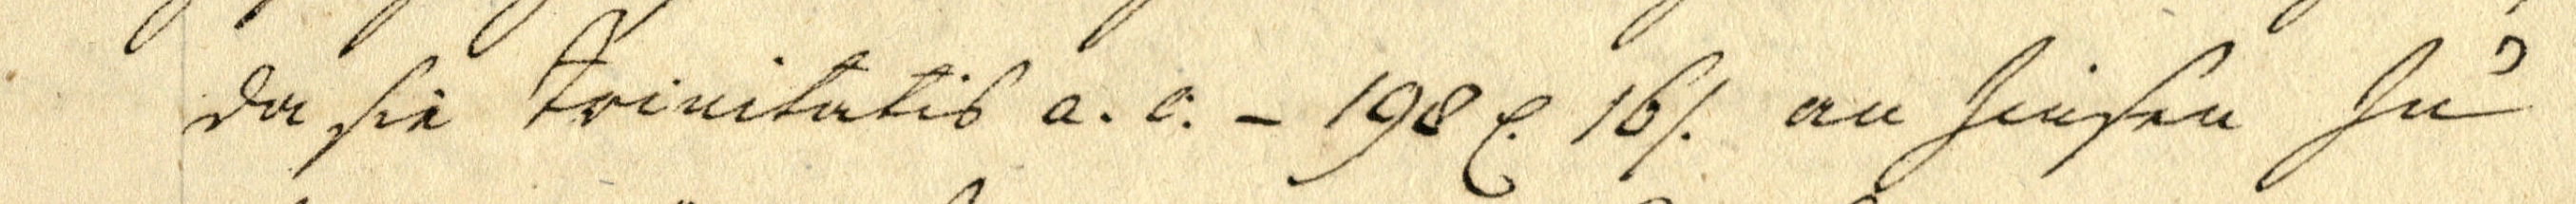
da sie Trinitatis a. c. 198 l. 16 s. an Zinsen zu
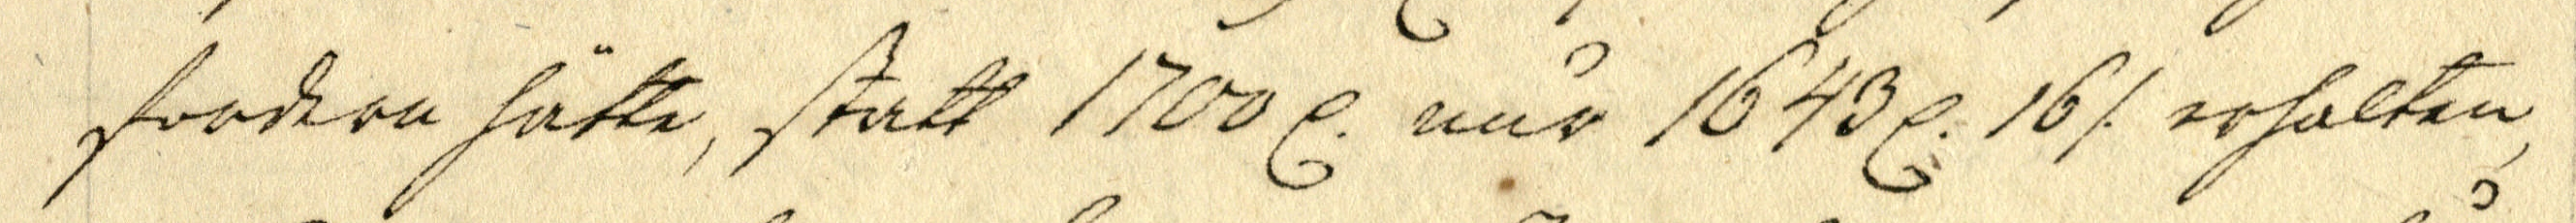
fordern hätte, statt 1700 l. nur 1643 l. 16 s. erhalten
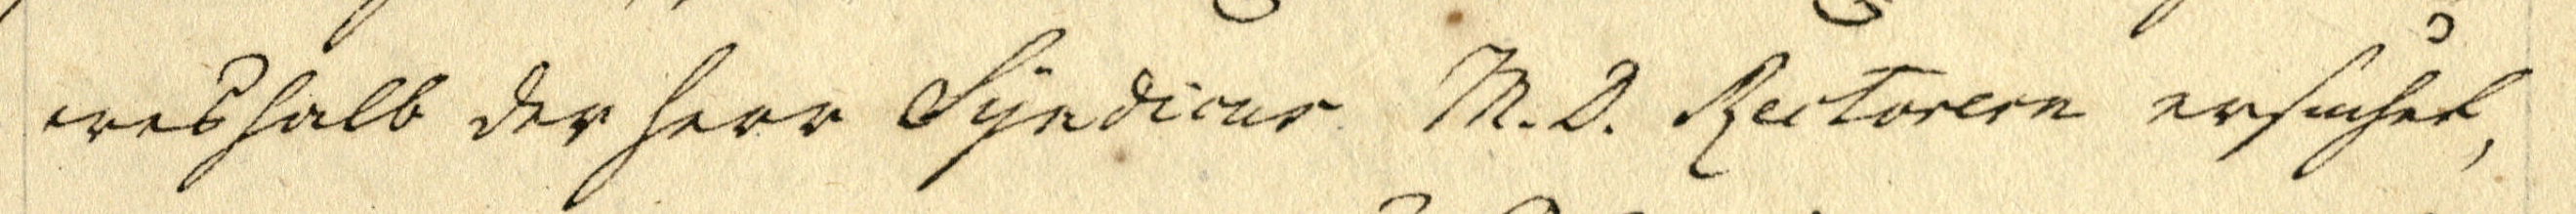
weshalb der herr Sÿndicus M. D. Rectorem ersuchet,
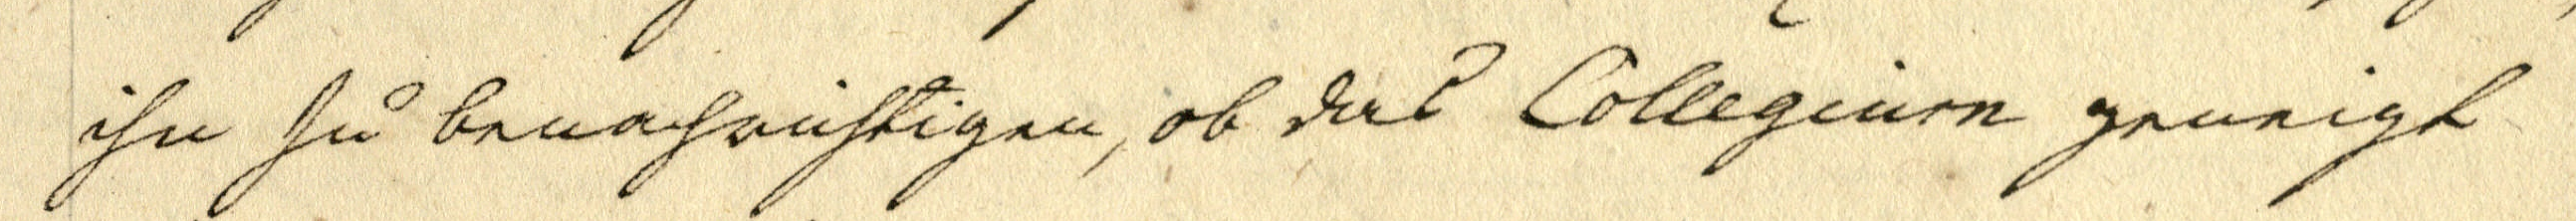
ihn zu benachrichtigen, ob das Collegium geneigt
